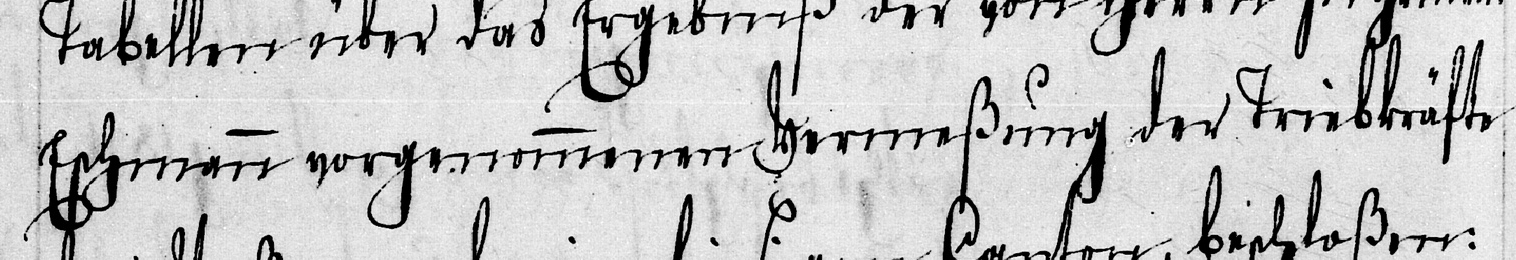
Eschmann vorgenommenen Vermeßung der Triebkräfte
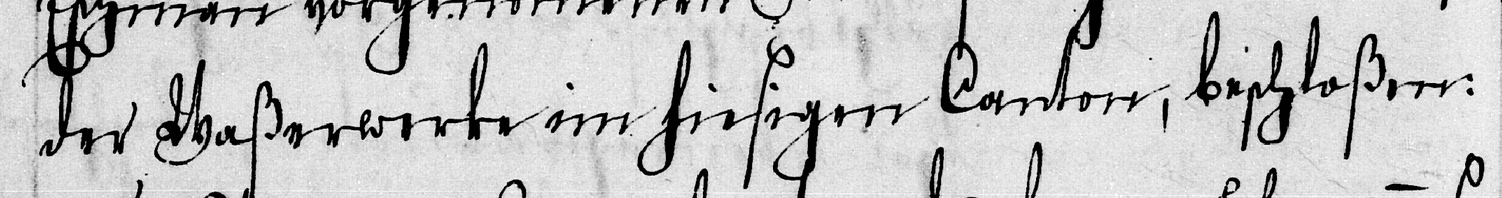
der Waßerwerke im hiesigen Canton, beschloßen:
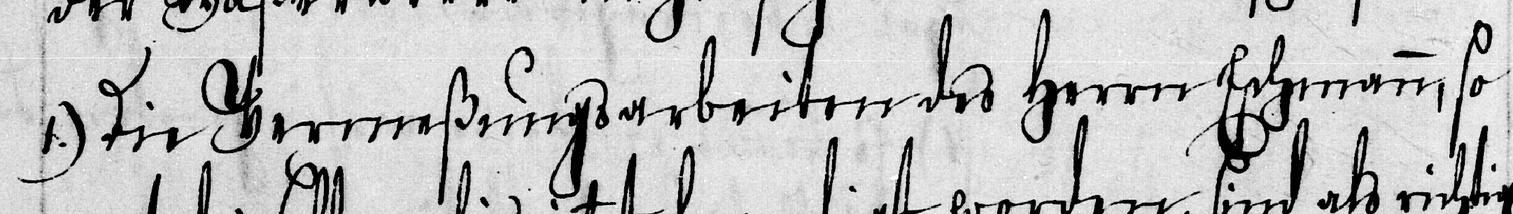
1.) Die Vermeßungsarbeiten des Herrn Eschmann, so
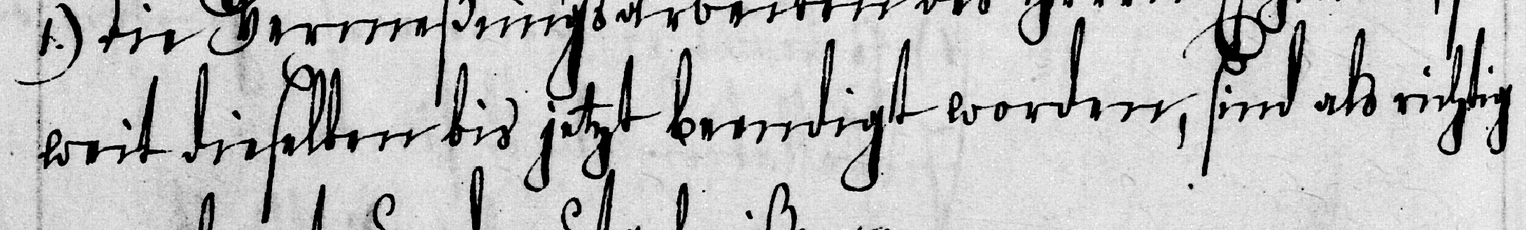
weit dieselben bis jetzt beendigt worden, sind als rich¬
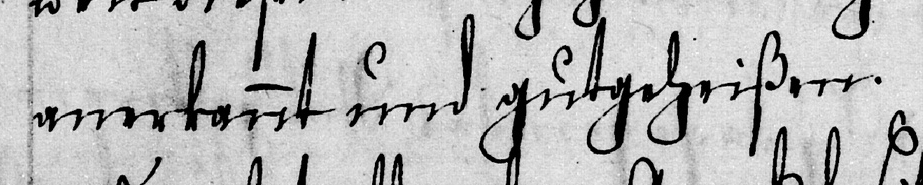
anerkannt und gutgeheißen.
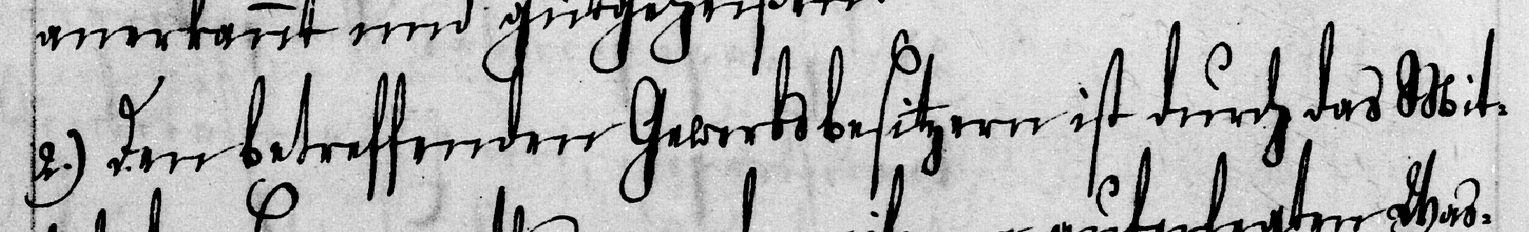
2.) Den betreffenden Gewerbsbesitzern ist durch das Mit¬
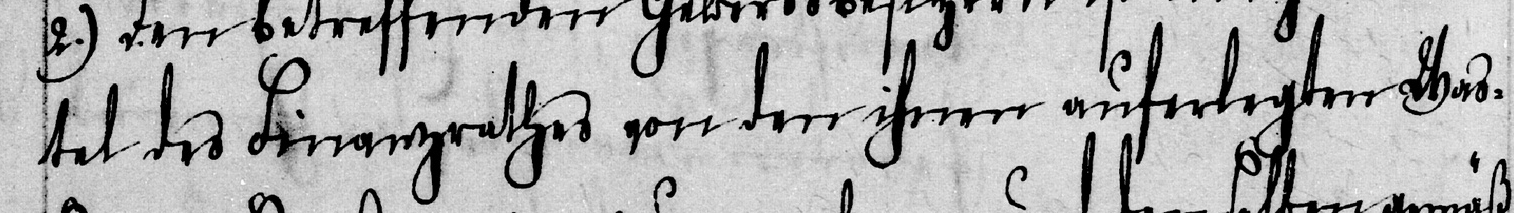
tel des Finanzrathes von den ihnen auferlegten Waß¬
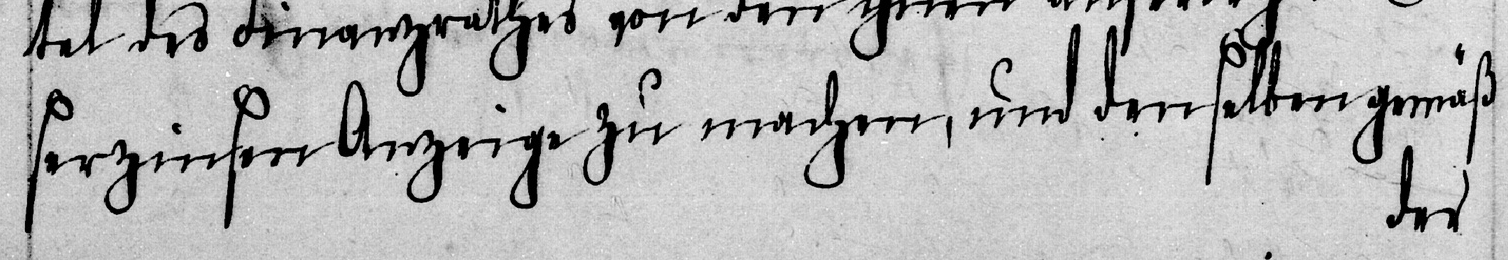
erzinsen Anzeige zu machen, und denselben gemäß
